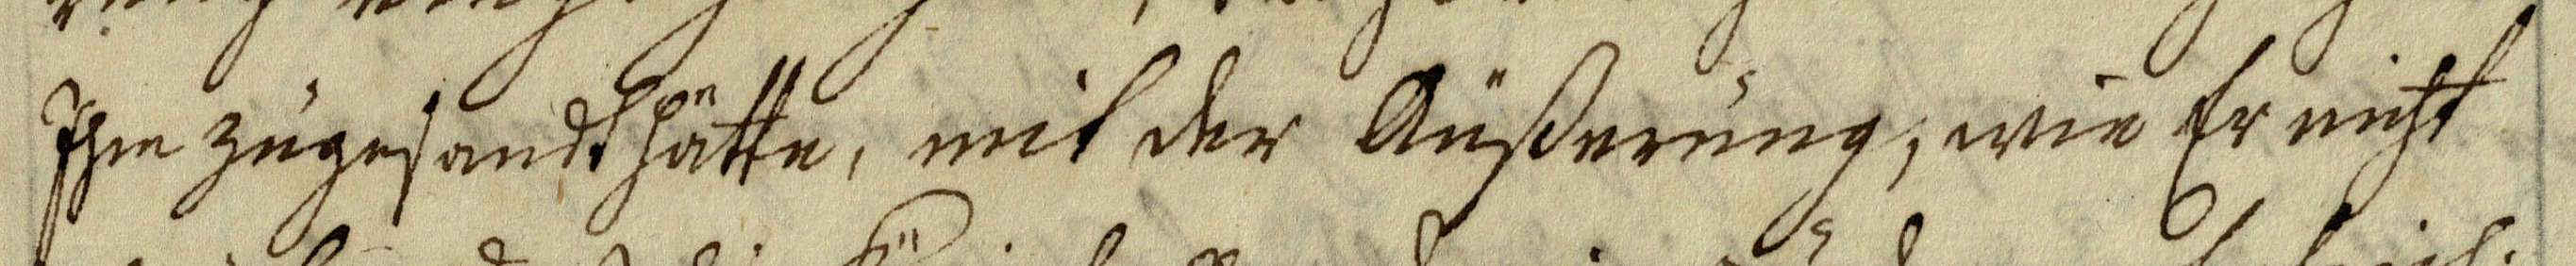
rung eingegangen, welche der Herr Amtshauptm.
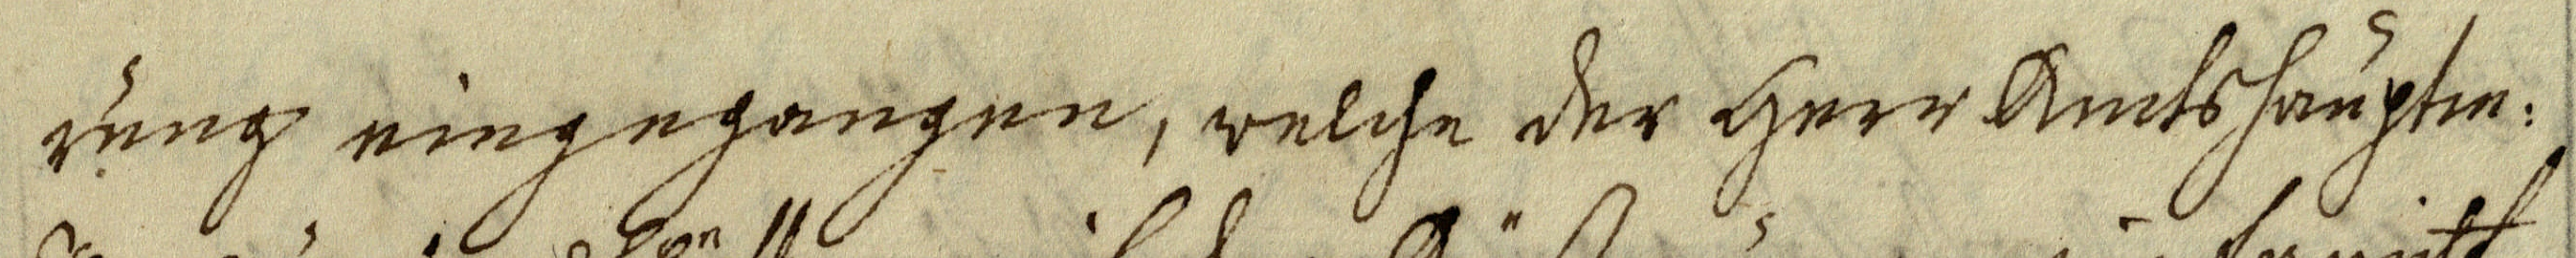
Ihm zugesandt hätte, mit der Äußerung, wie Er nicht
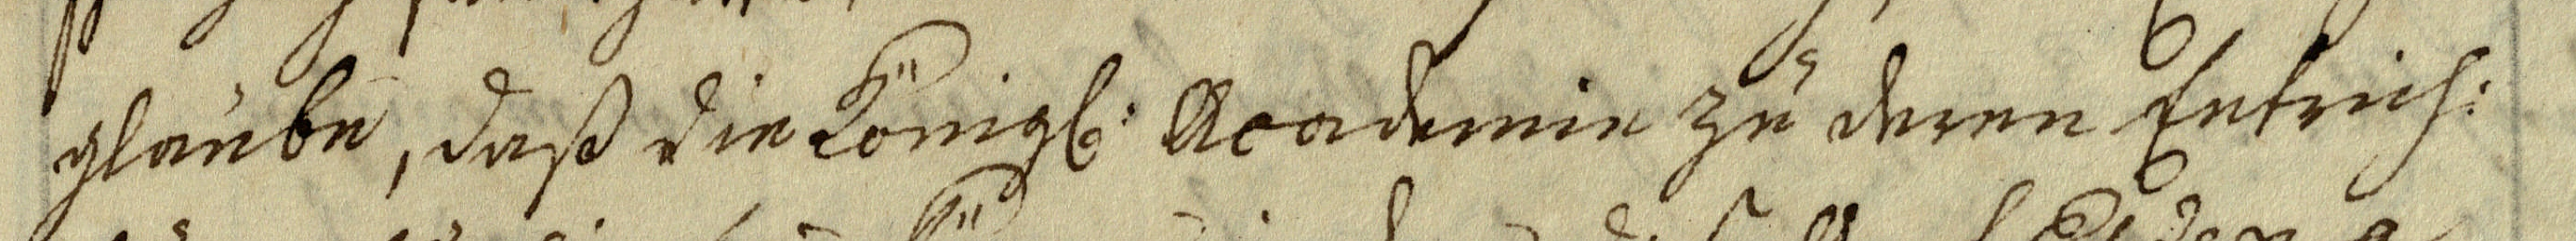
glaube, daß die Königl. Academie zu deren Entrich¬
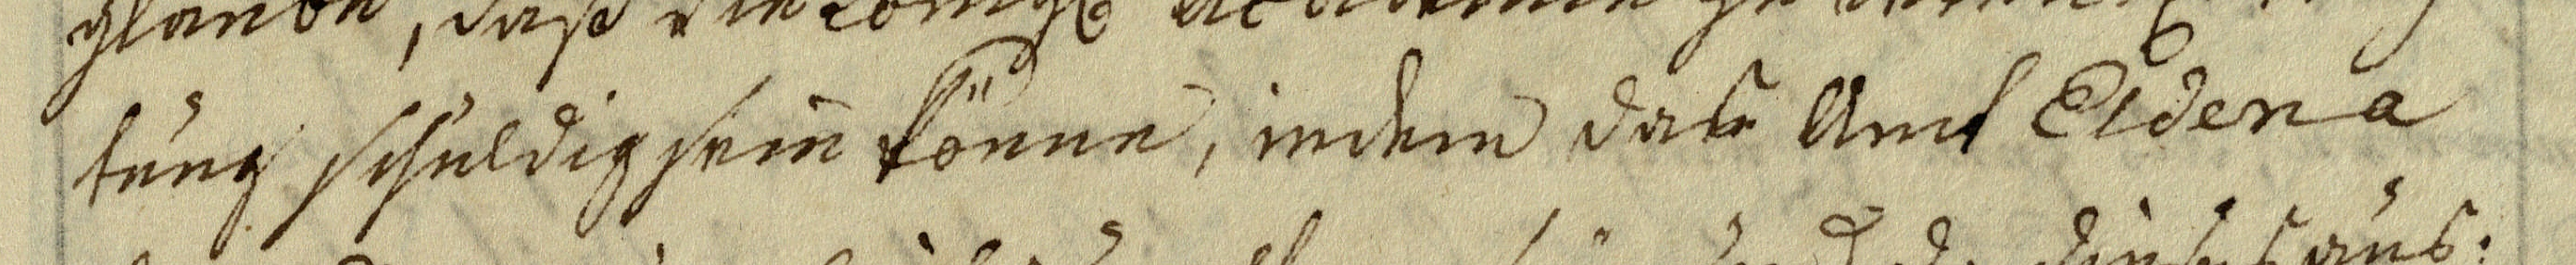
tung schuldig sein könne, indem das Amt Eldena
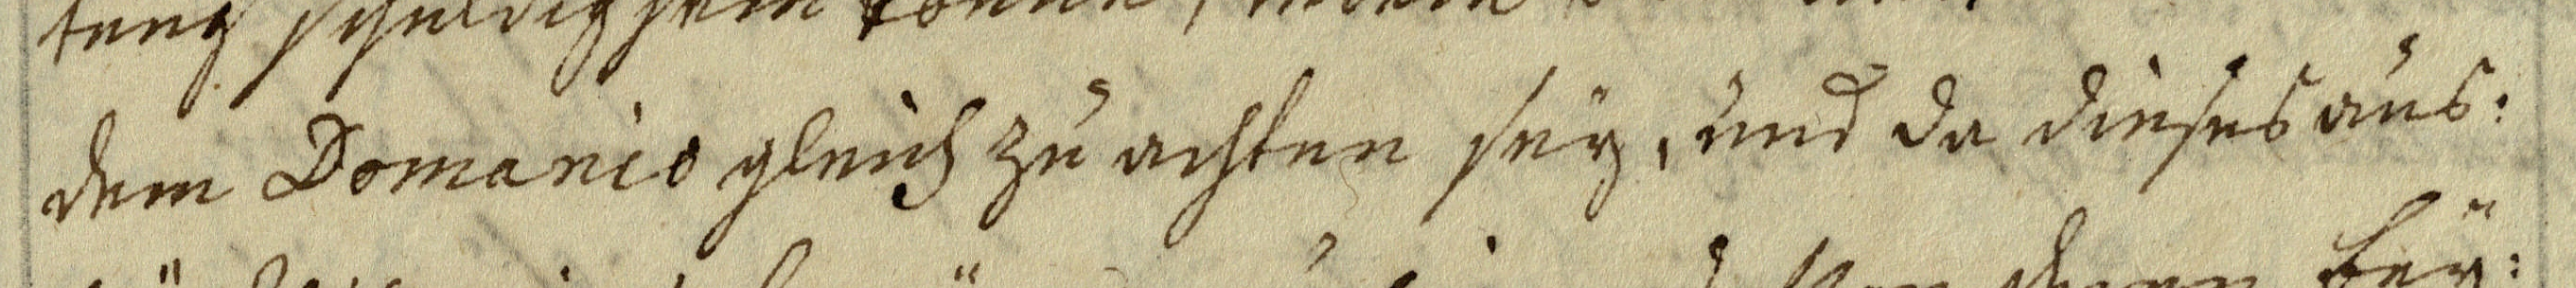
dem Domanio gleich zu achten seÿ, und da dieses aus¬
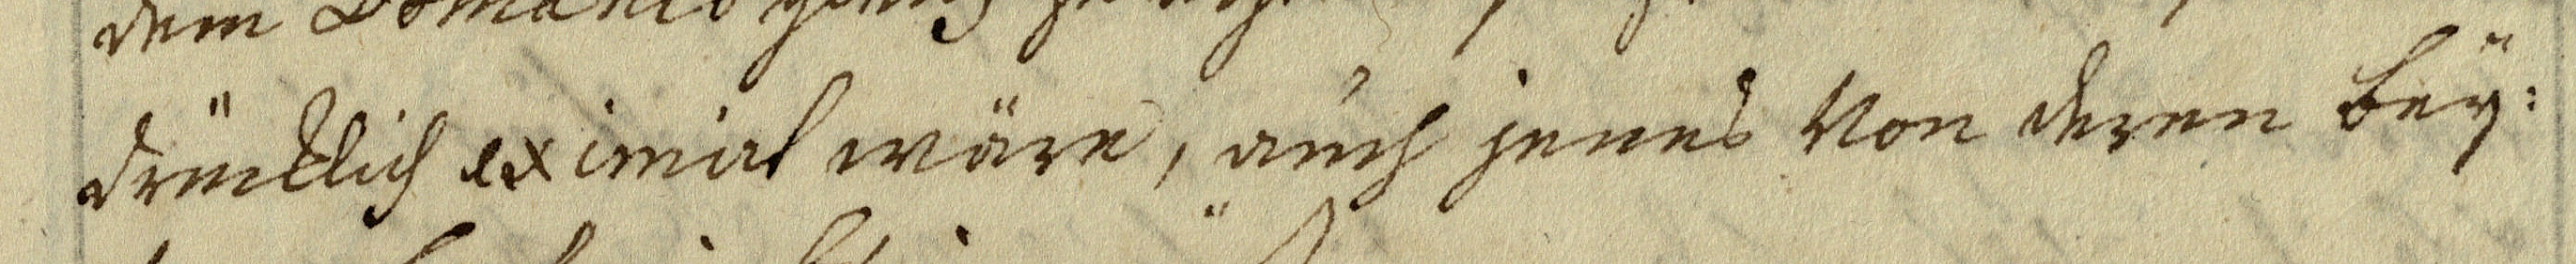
drücklich ex imirt wäre, auch jenes von deren Beÿ¬
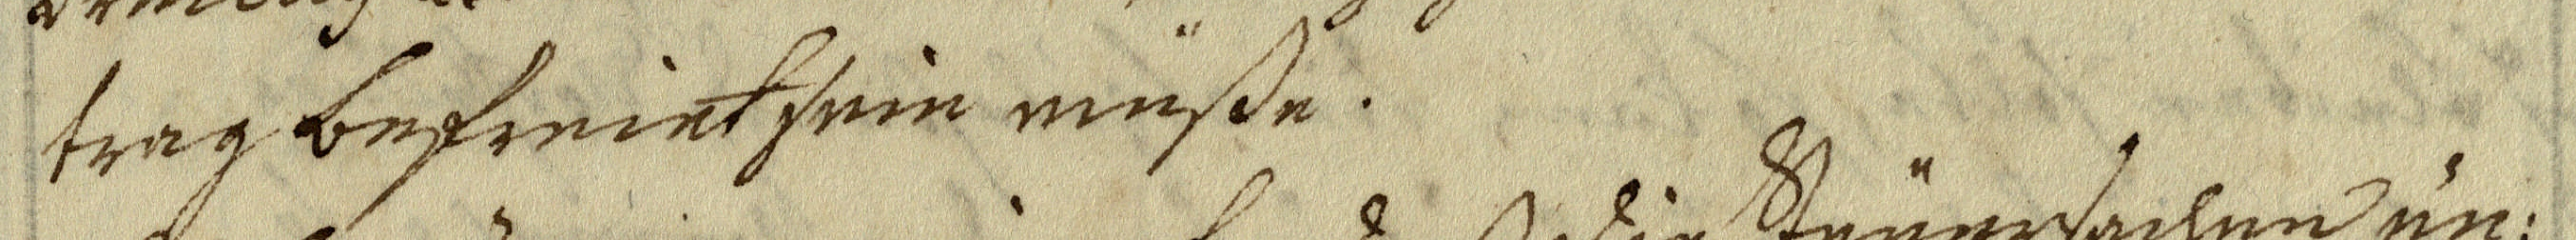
trag befreiet sein müße.
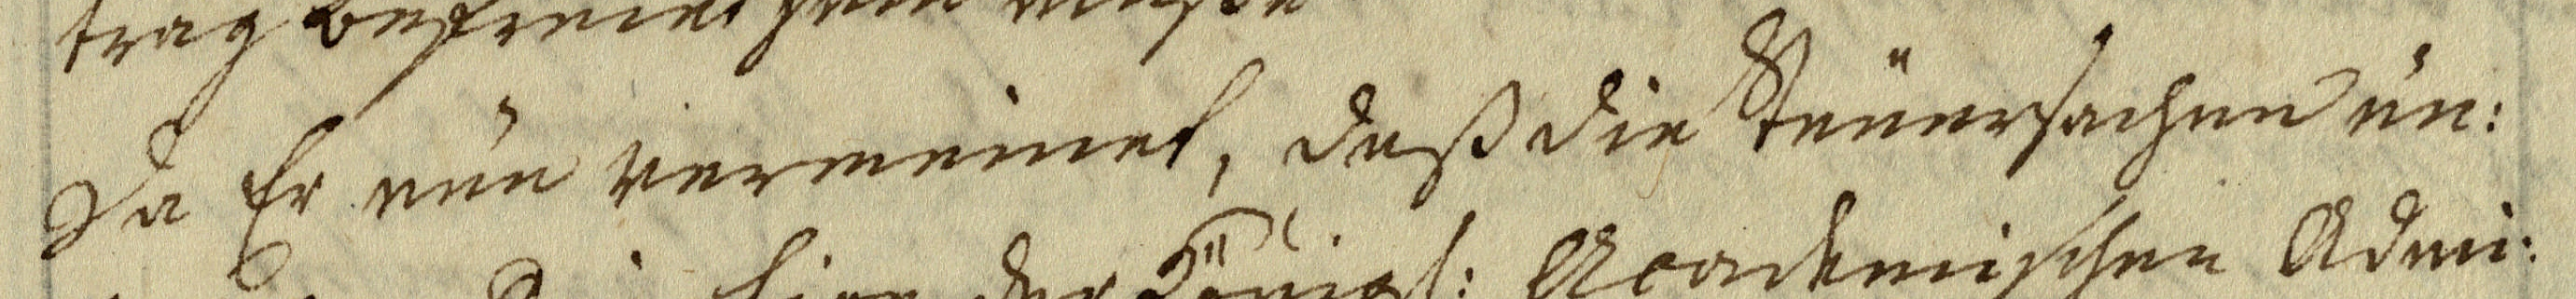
Da Er nun vermeinet, daß die Steuersachen un¬
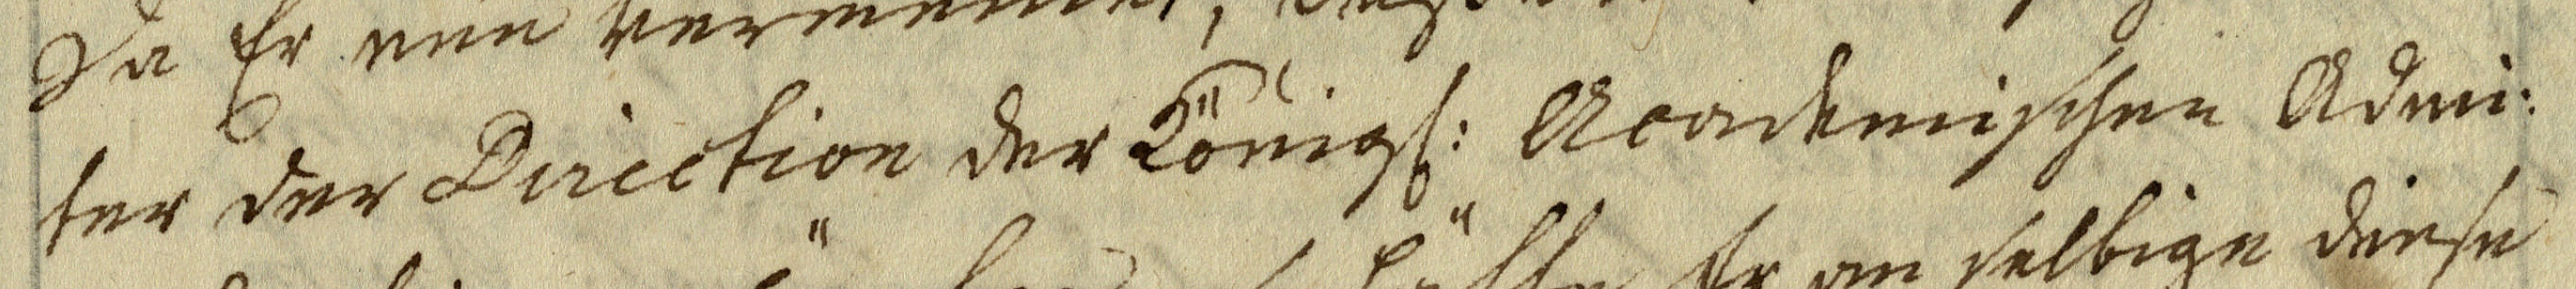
ter der Direction der Königl. Academischen Admi¬
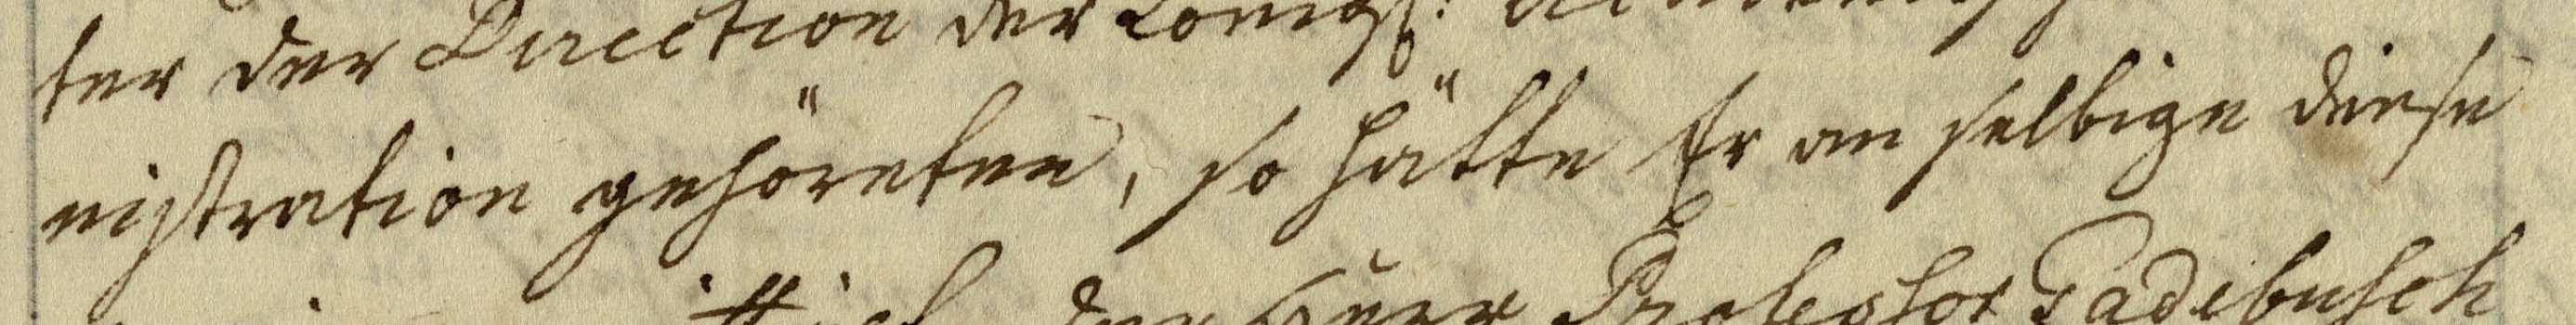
nistration gehöreten, so hätte Er an selbige diese
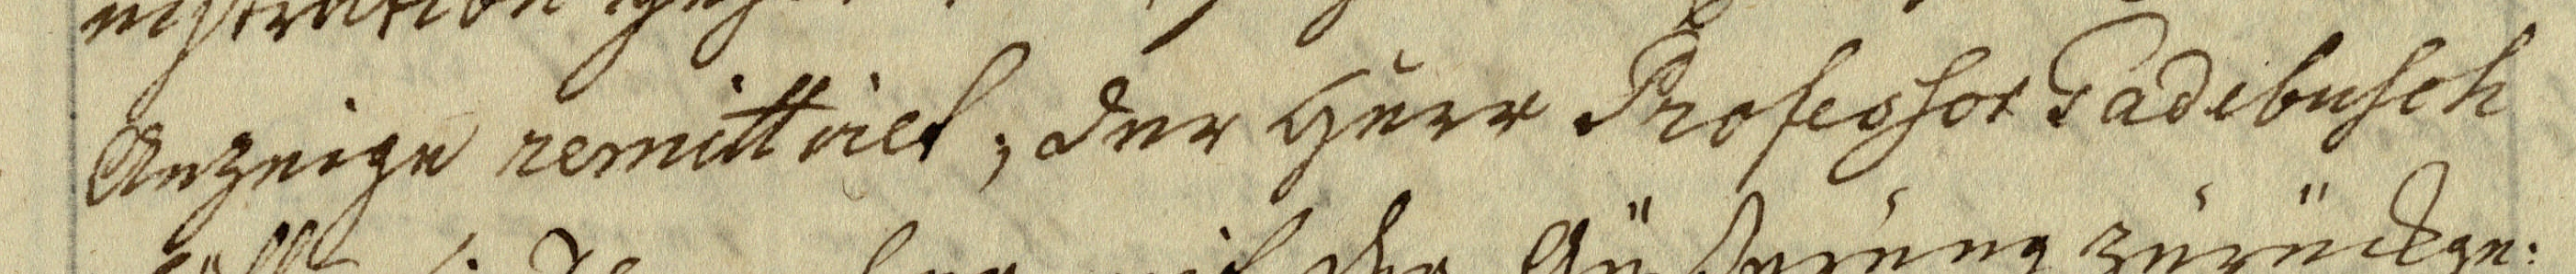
Anzeige remittiret, der Herr Professor Gadebusch
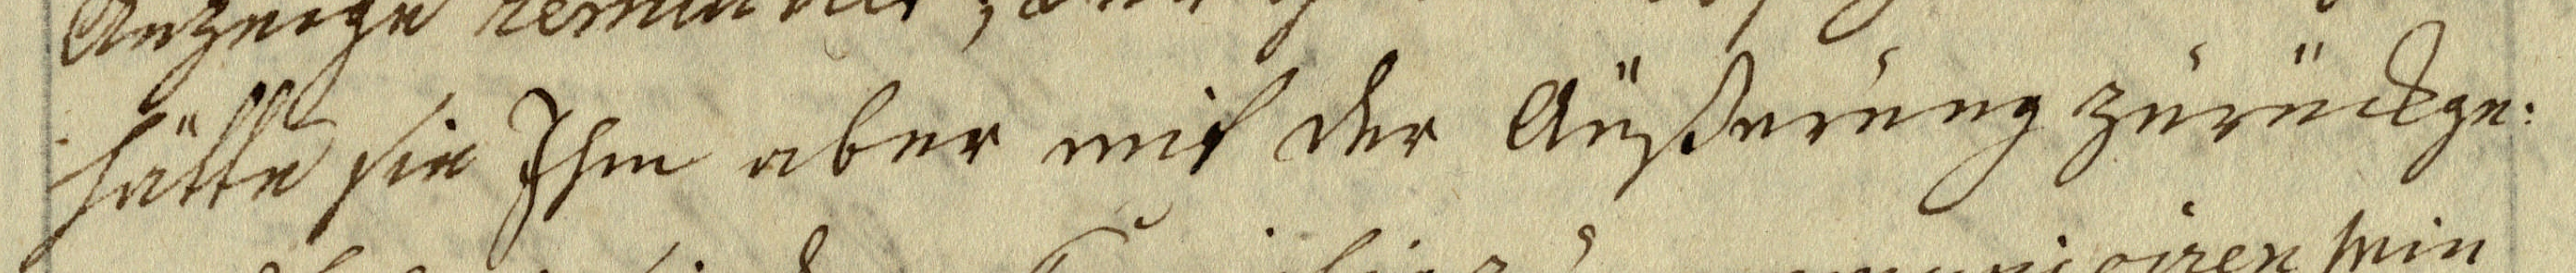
hätte sie Ihm aber mit der Äußerung zurückge¬
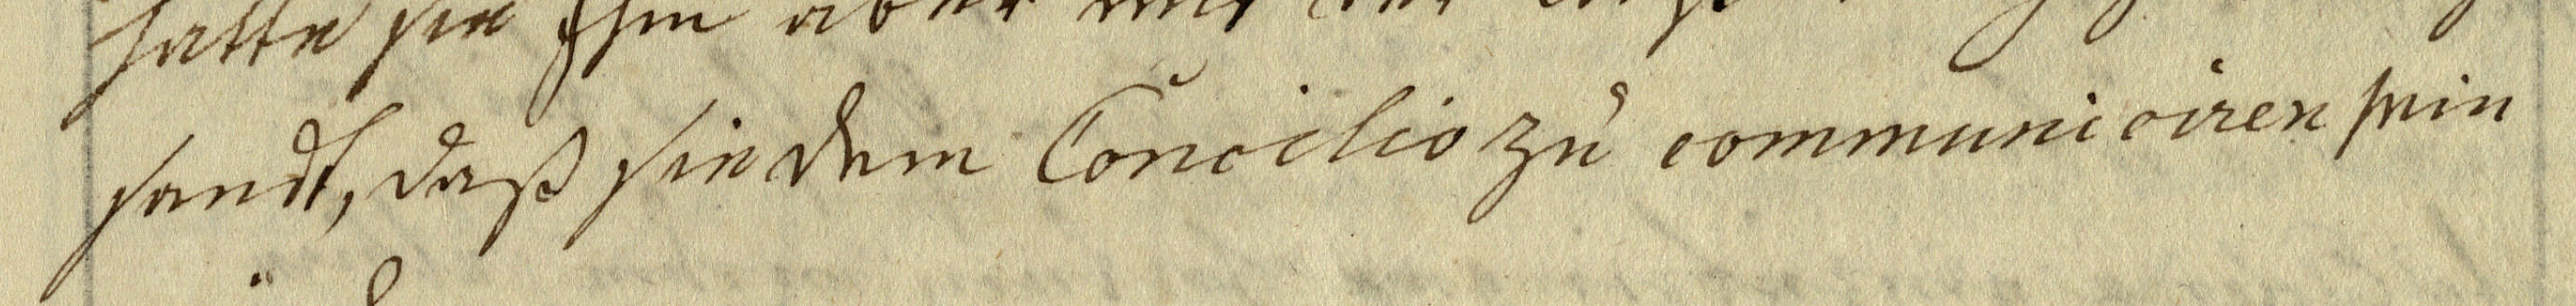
sandt, daß sie dem Concilio zu communiciren sein
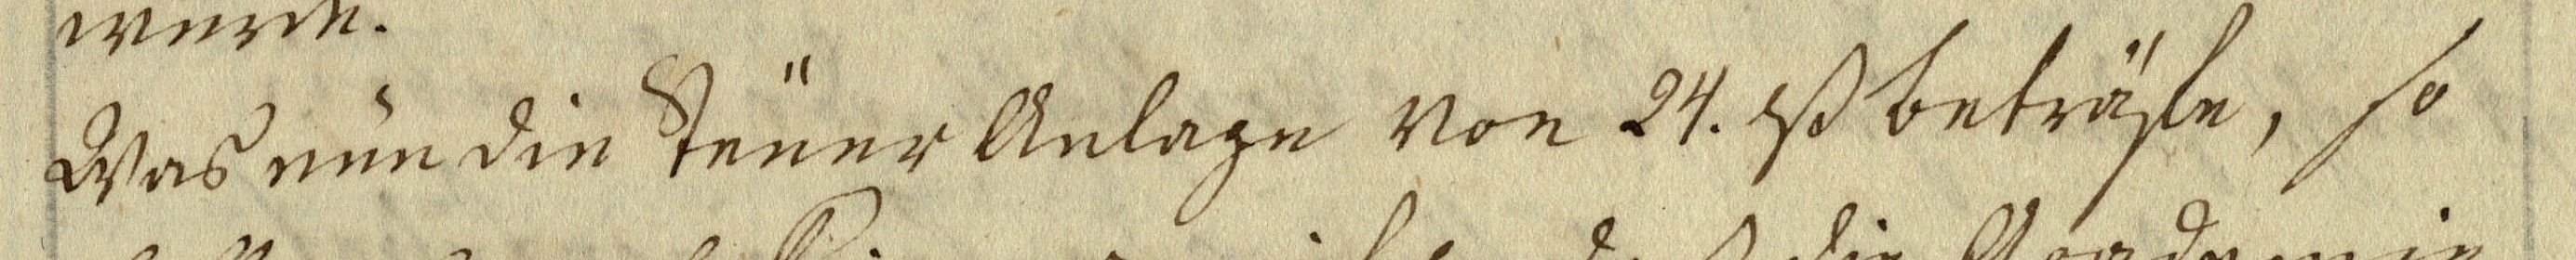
Was nun die Steuer Anlage von 24. s beträfe, so
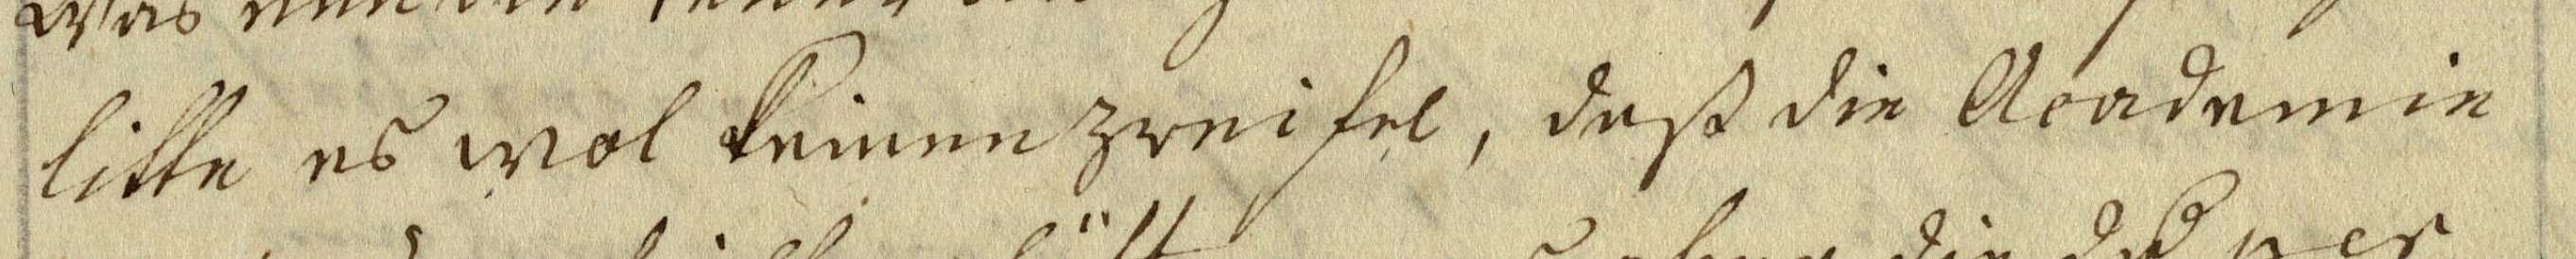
litte es wol keinen Zweifel, daß die Academie
